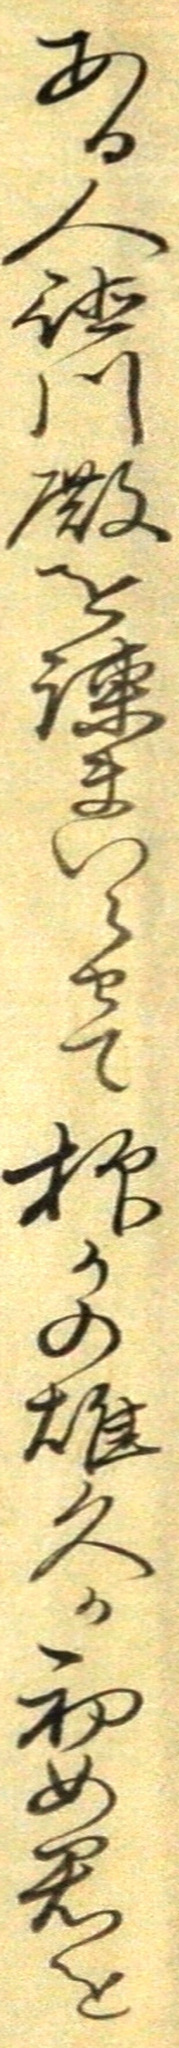ある人徳川殿を諫まいらせて抑かの雄久か初め君を
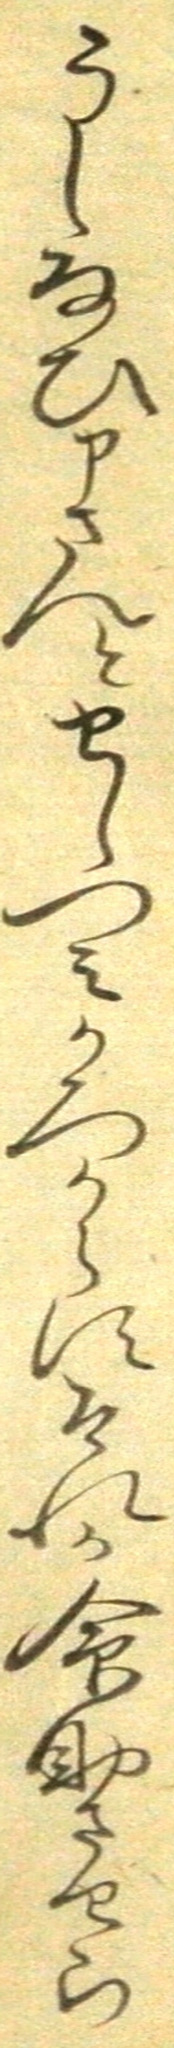うしなひ申さんとせしつみかろからすそれか命助させら
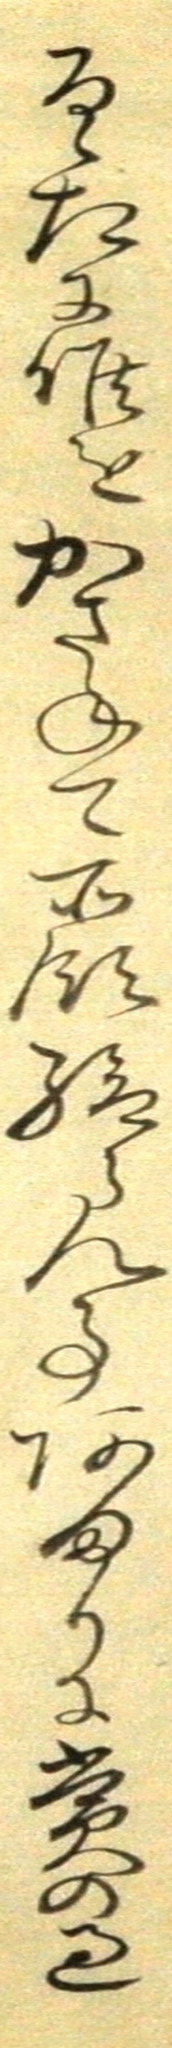るゝたに候をかさねて所領給らん事あまりに賞の過
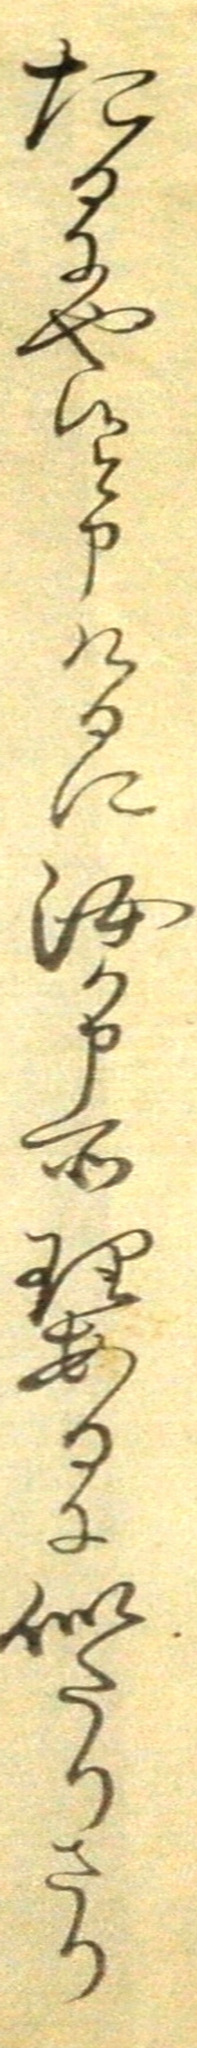たるにや候と申けるに汝か申所理あるに似たりさり
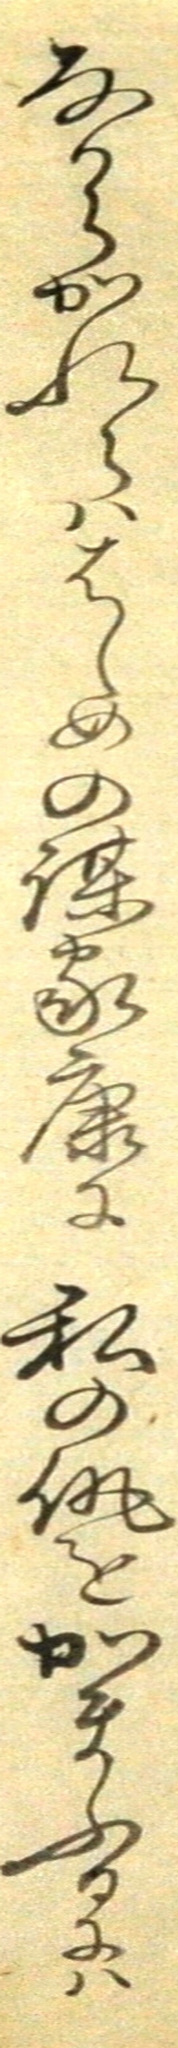なからかれらははしめの謀家康に私の仇をかまふるには
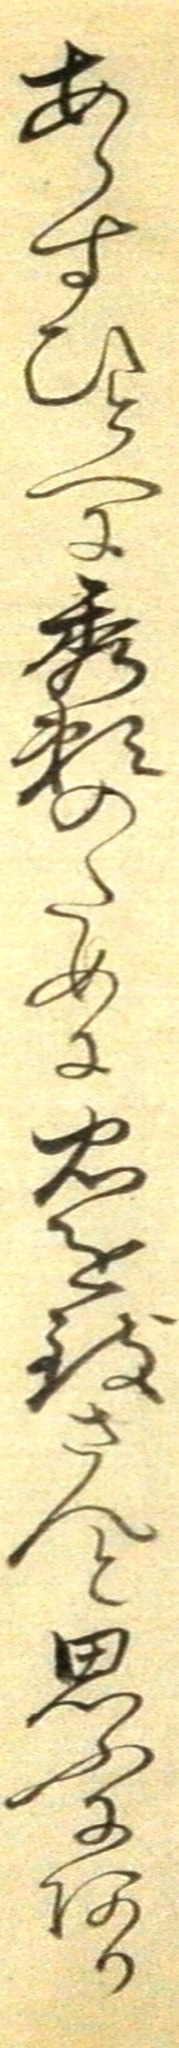あらすひとへに秀頼のために忠を致さんと思ふにあり
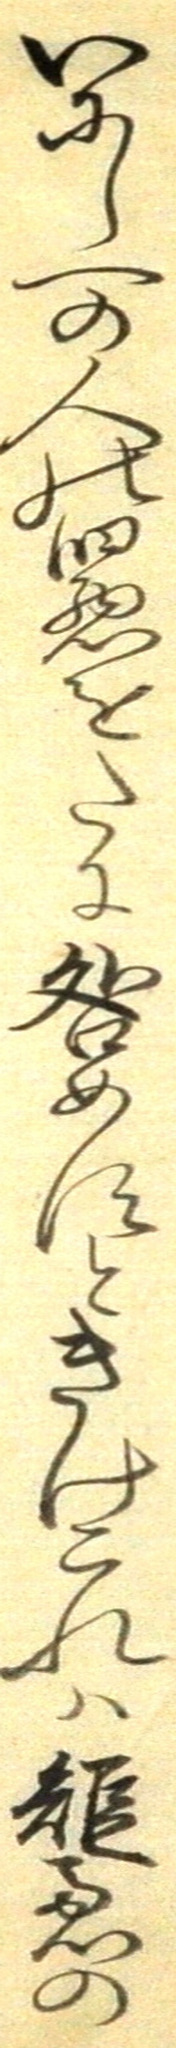いにしへの人の旧悪をたに咎めすときけこれは短慮の
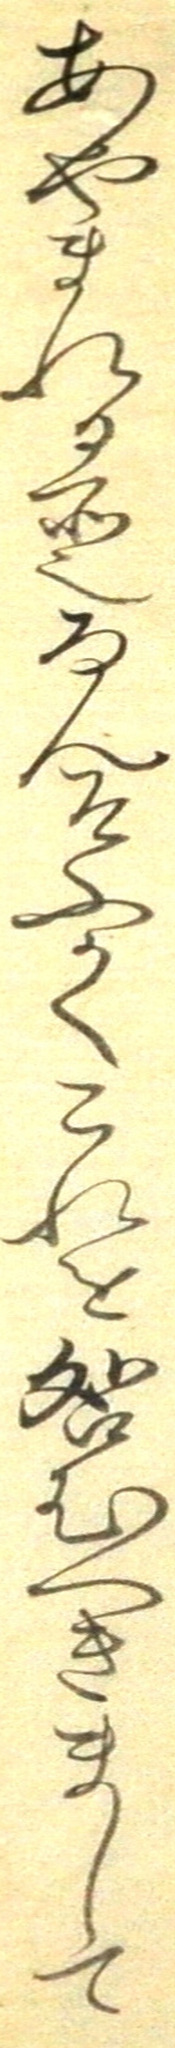あやまれる所也なんそふかくこれを咎むへきまして
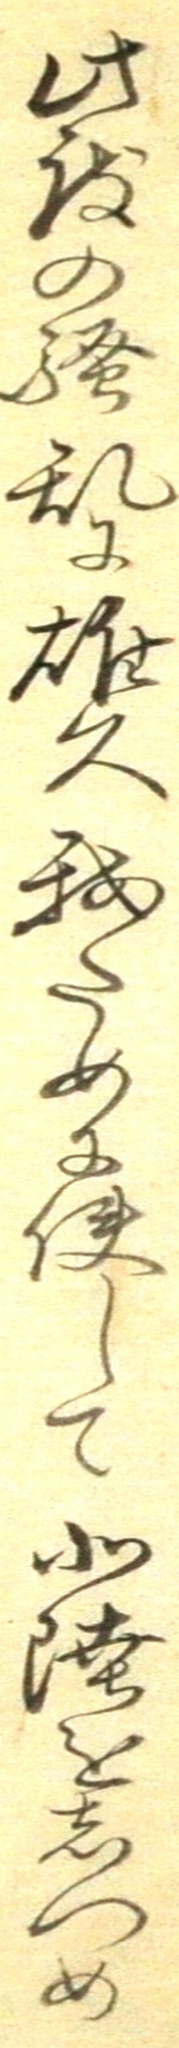此度の騤乱に雄久我ために使して北陸をしつめ
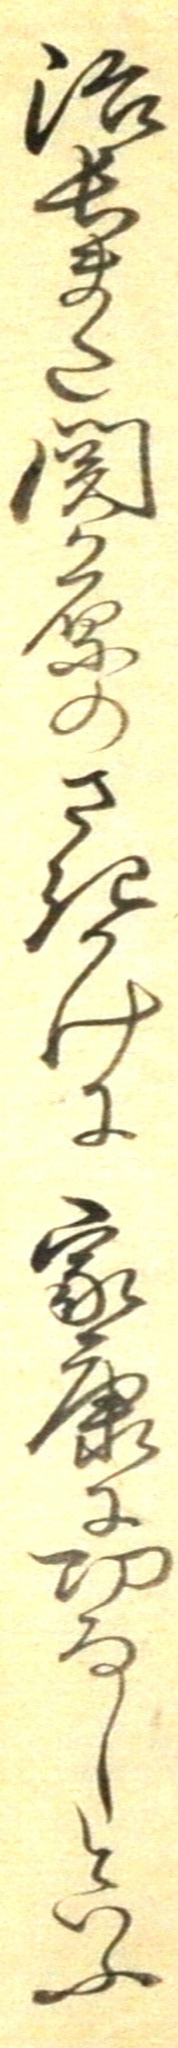治長また関か原のさきかけに家康に功なしといふ
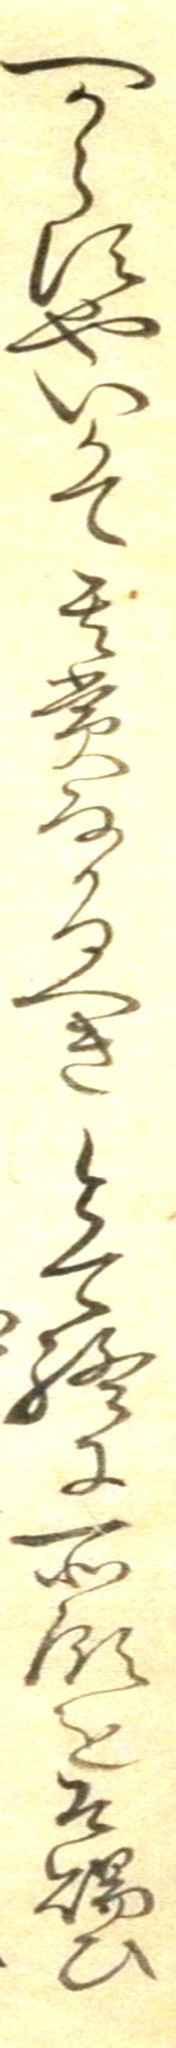へからすやいかて其賞なかるへきとて終に所領をそ賜ひ
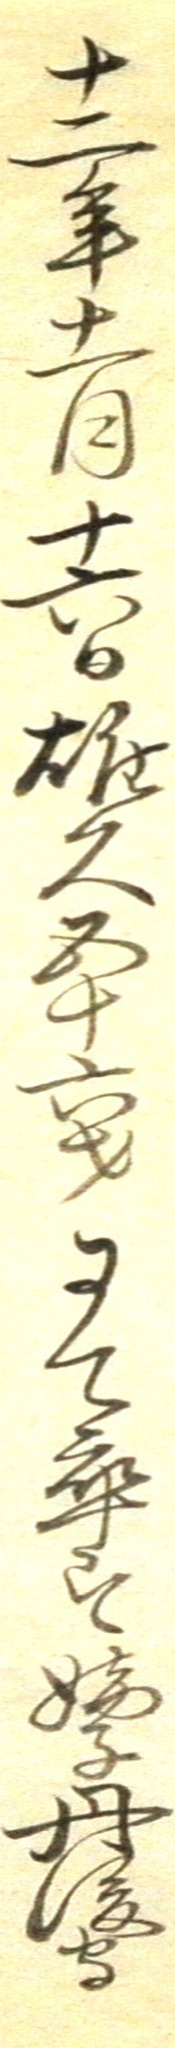十二年十一月十六日雄久五十六才にて卒す嫡子丹後守
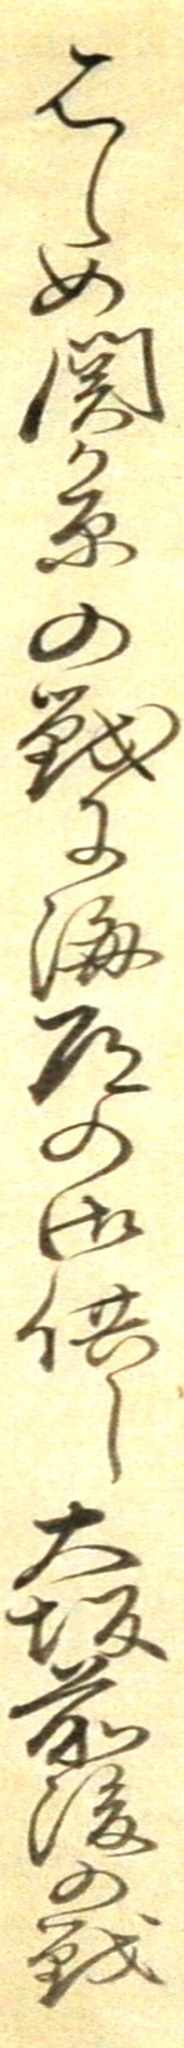はしめ関か原の戦に海道の御供し大坂前後の戦
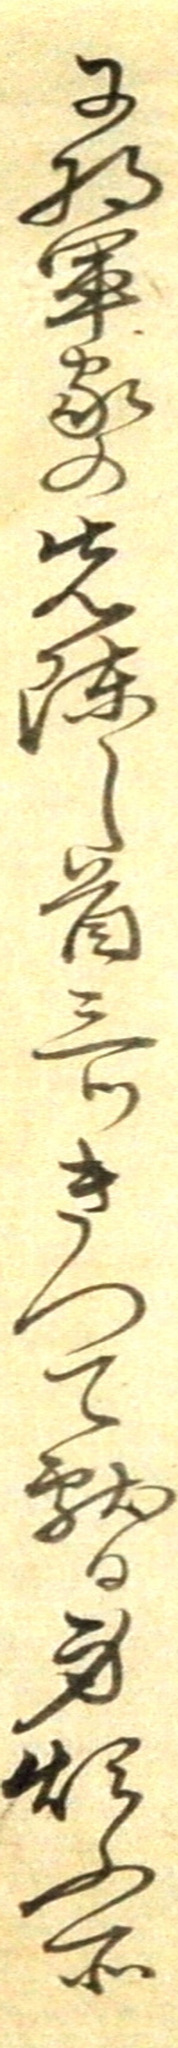に将軍家の先陣し首三ツきつて献る身煩ふ所
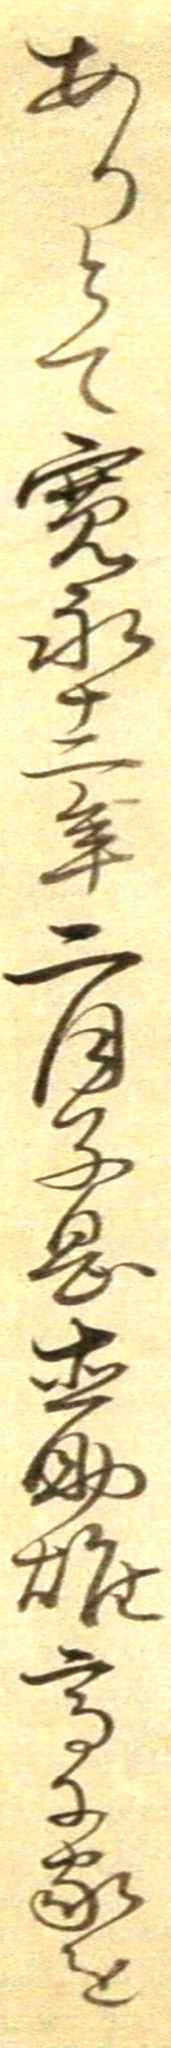ありとて寛永十二年二月子息直助雄高に家を
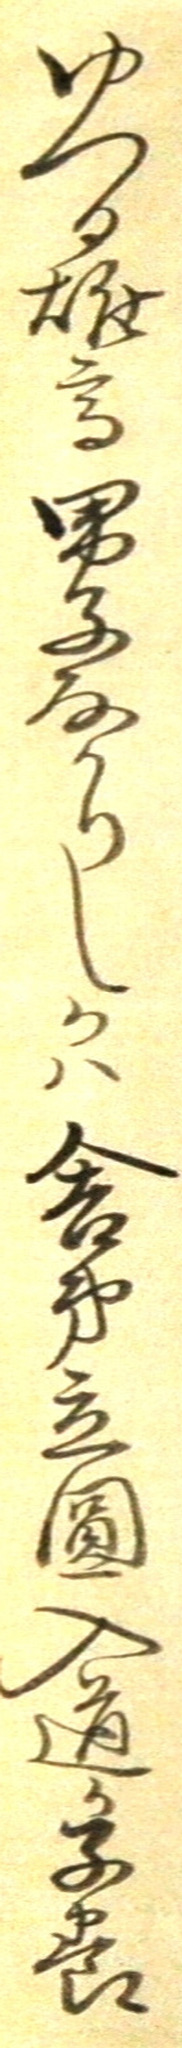ゆつる雄高男子なかりしかは舎弟立円入道か子養
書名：藩翰譜（八・下）
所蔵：伊那市立高遠町図書館・合同会社AMANE
